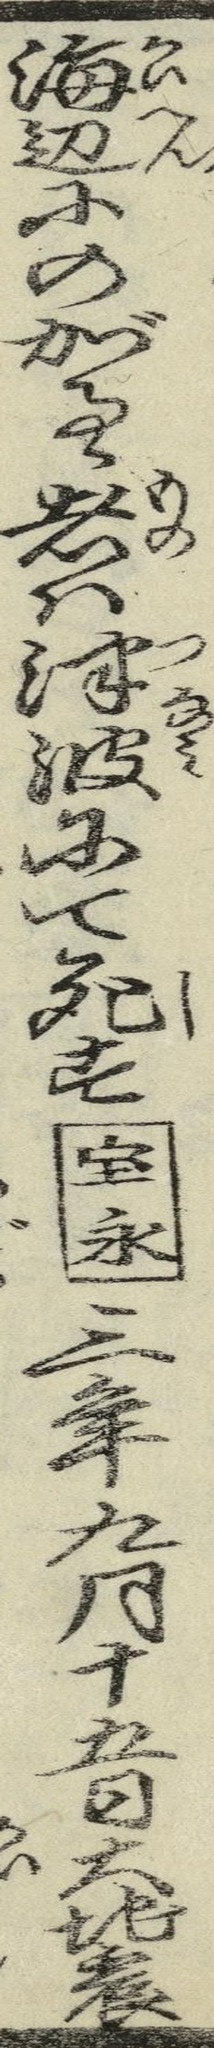海辺にのがるゝ者は津波にて死す宝永三年九月十五日大地震
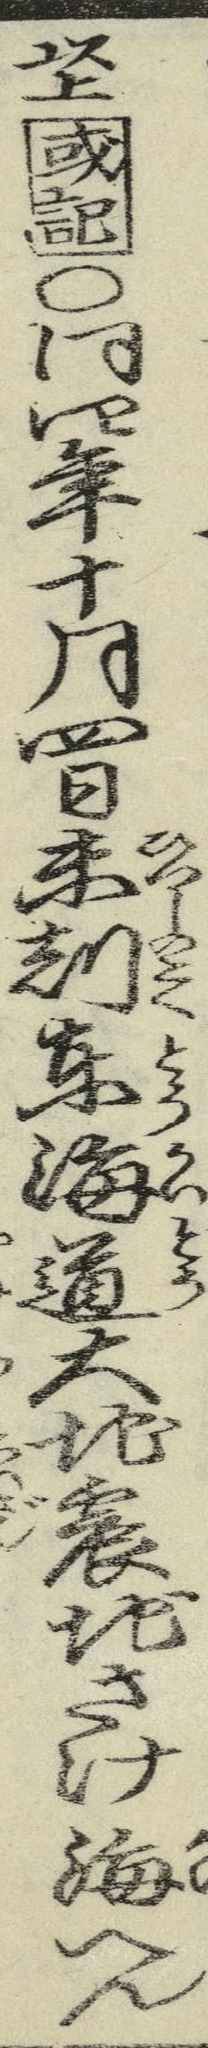以上或記○同四年十月四日未刻東海道大地震地さけ海へん
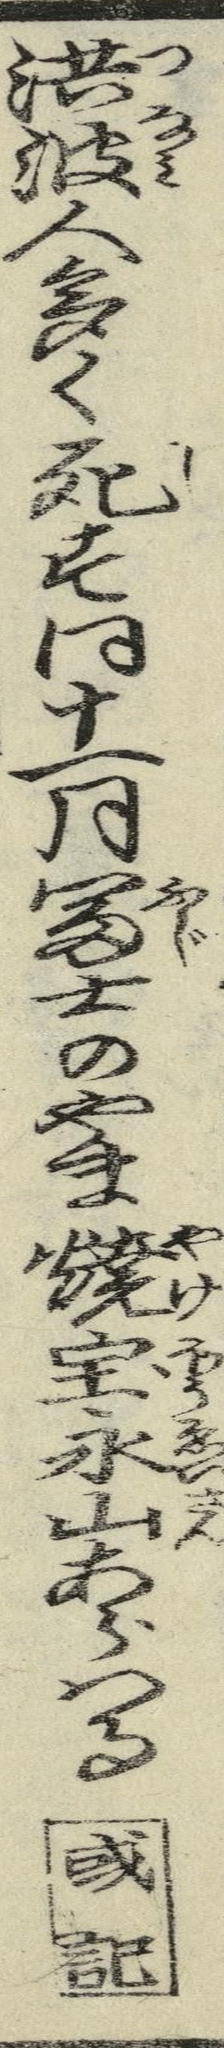洪波人多く死す同十一月富士のやま焼宝永山あらはる或記
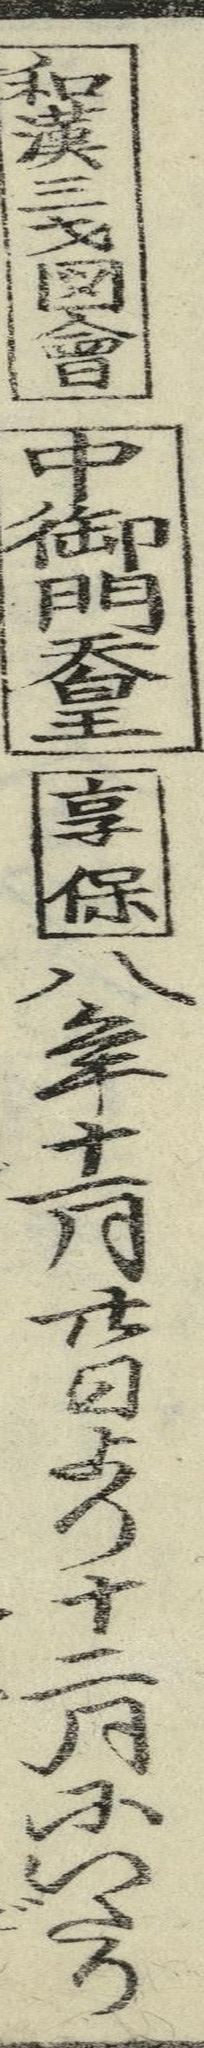和漢三才図会中御門天皇享保八年十一月廿日より十二月にいたり
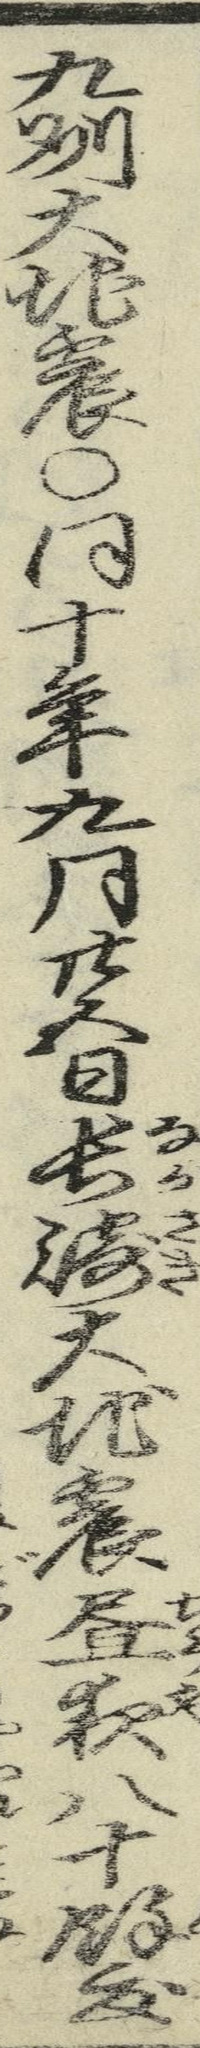九州大地震○同十年九月廿五日長崎大地震昼夜八十余度
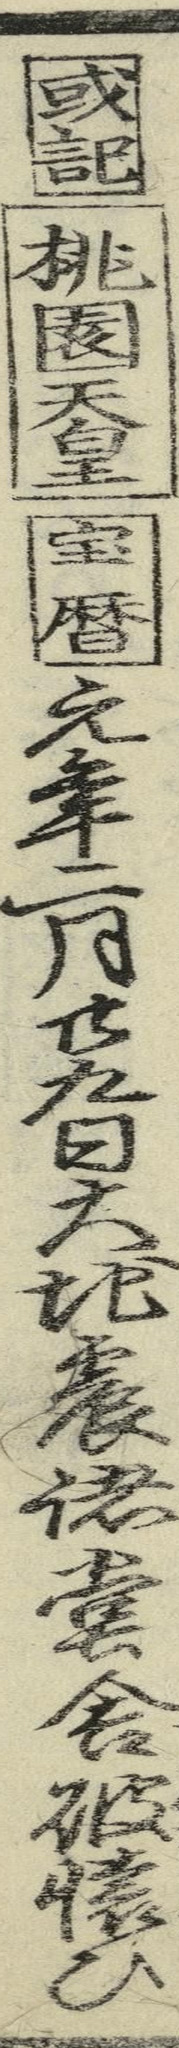或記桃園天皇宝暦元年二月廿九日大地震諸堂舎破懐ひ

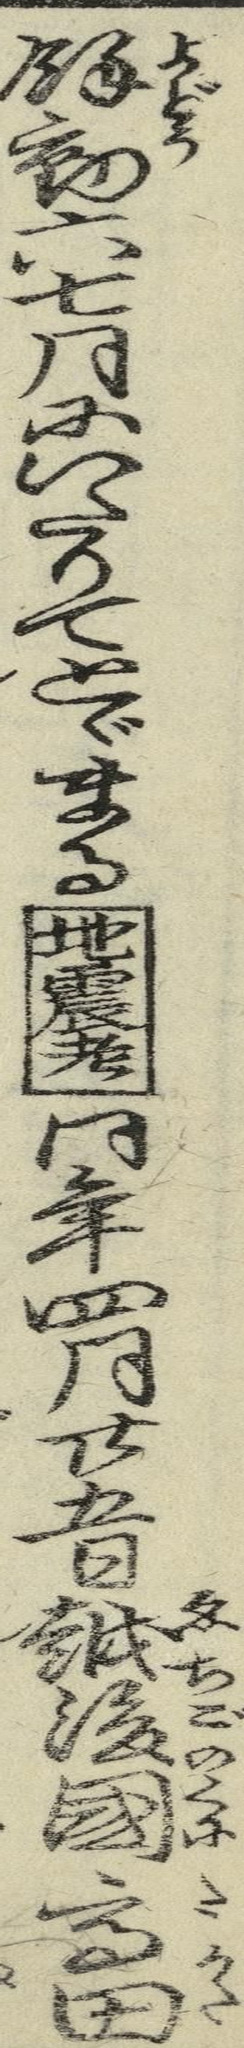余動六七月にいたりてとゞまる地震考同年四月廿五日越後国高田
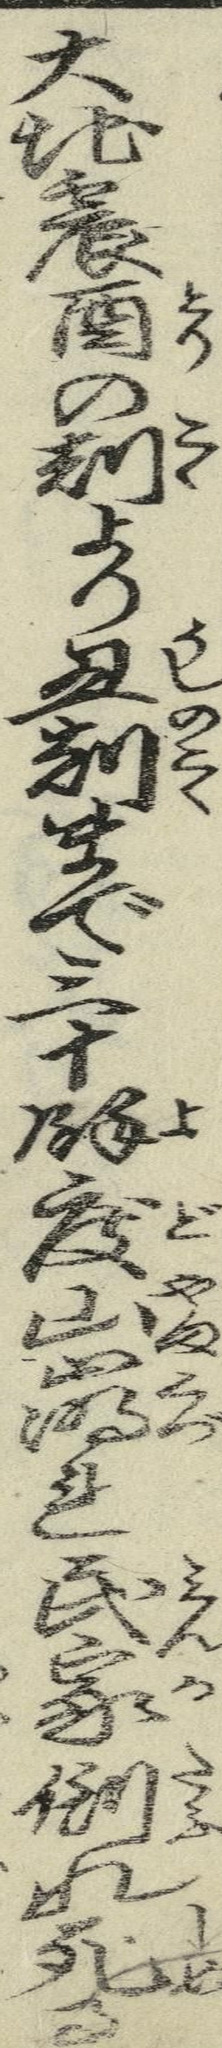大地震酉の刻より丑刻まで三十余度山崩れ民家倒れ死る
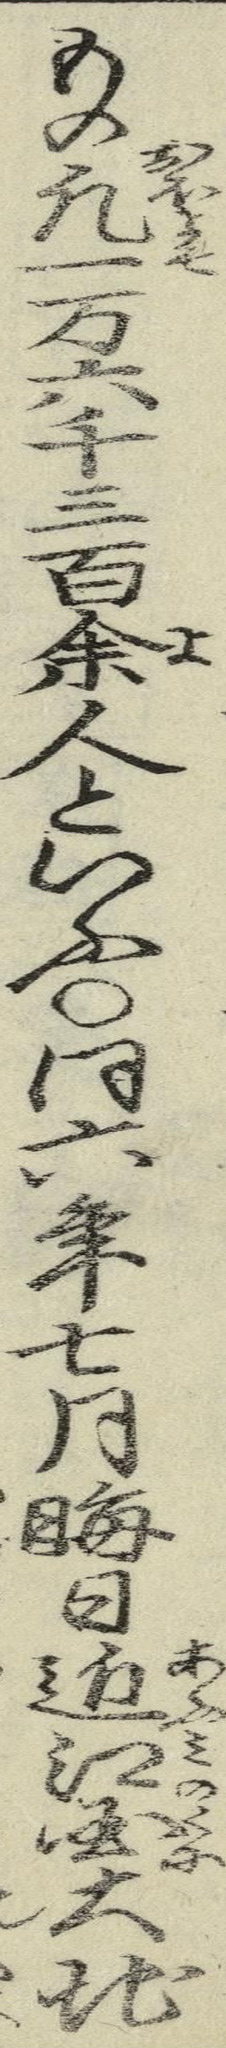もの凡一万六千三百余人といふ○同六年七月晦日近江国大地
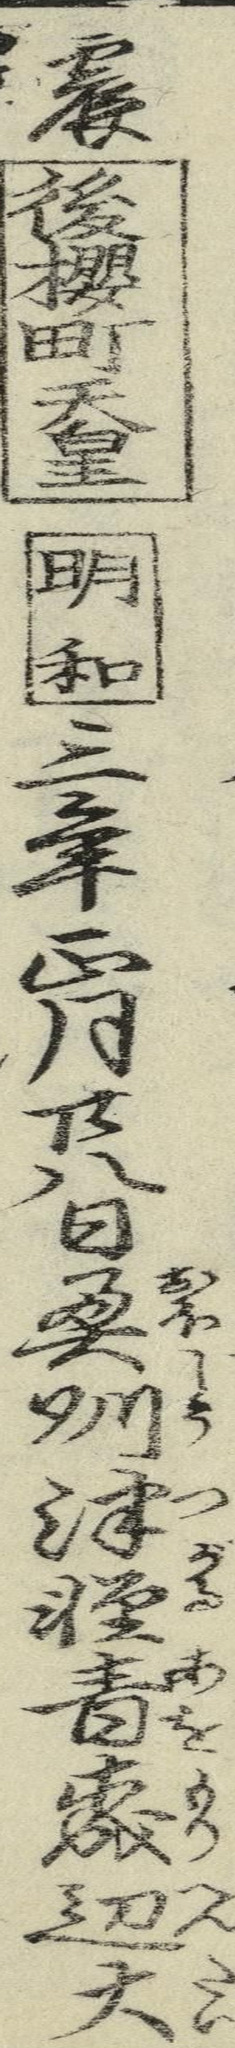震後桜町天皇明和三年正月廿八日奥州津軽青森辺大
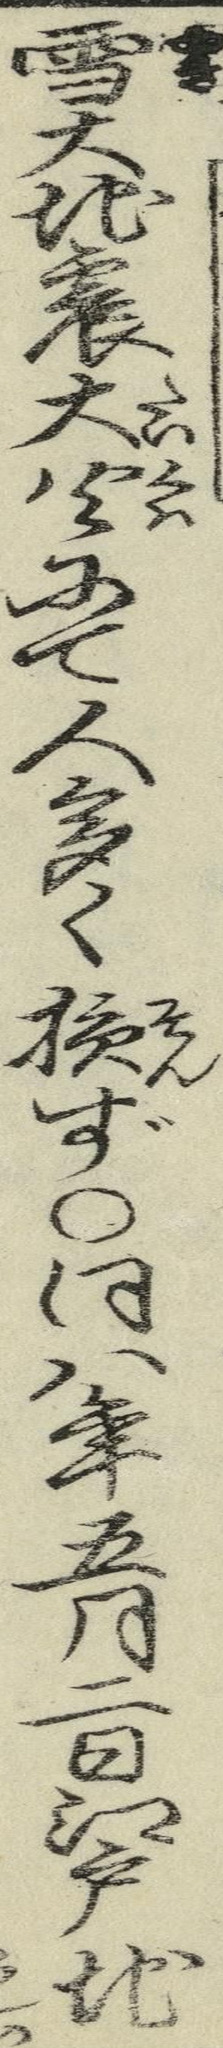雪大地震大火にて人多く損ず○同八年五月二日江戸地
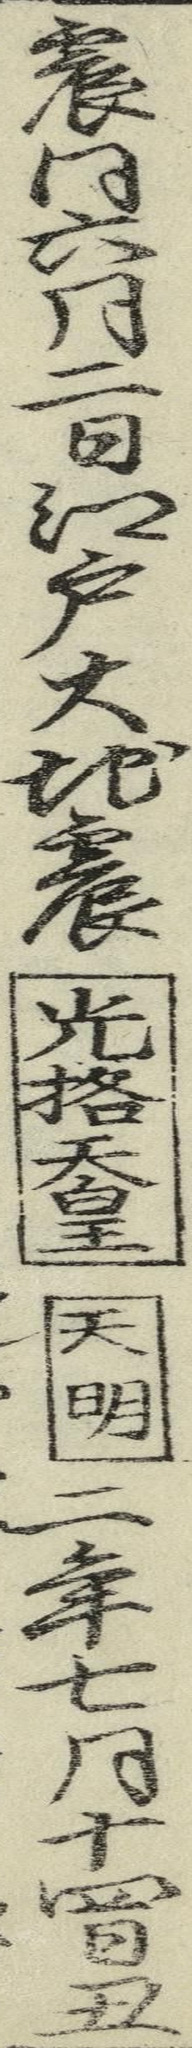震同六月二日江戸大地震光格天皇天明二年七月十四日丑
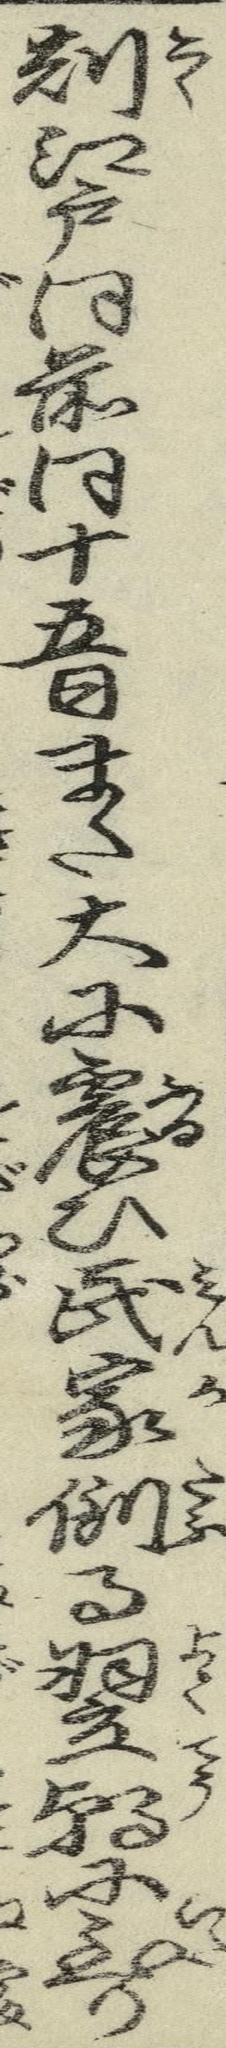刻江戸同前同十五日また大に震ひ民家倒る翌朝に至り
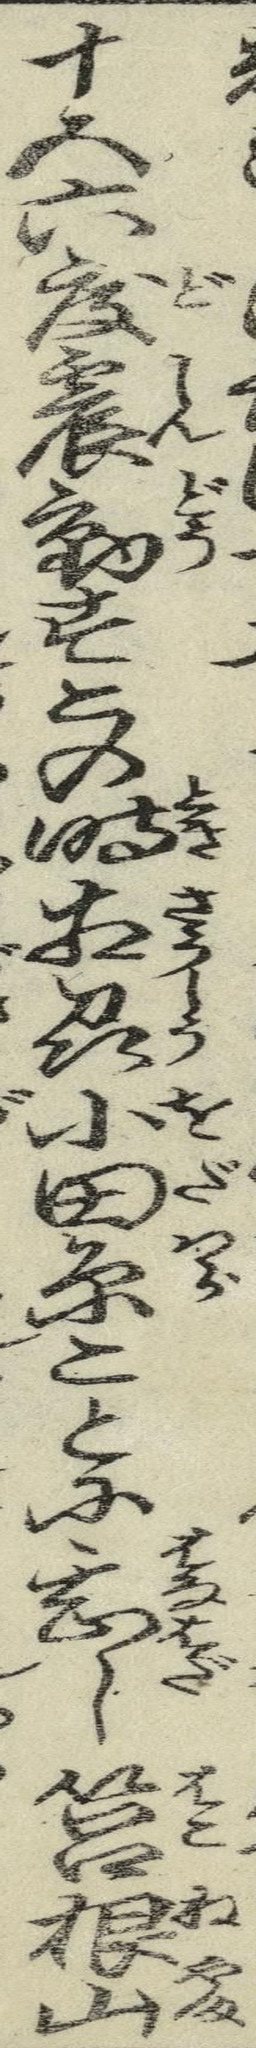十五六度震動すこの時相州小田原ことに甚し筥根山
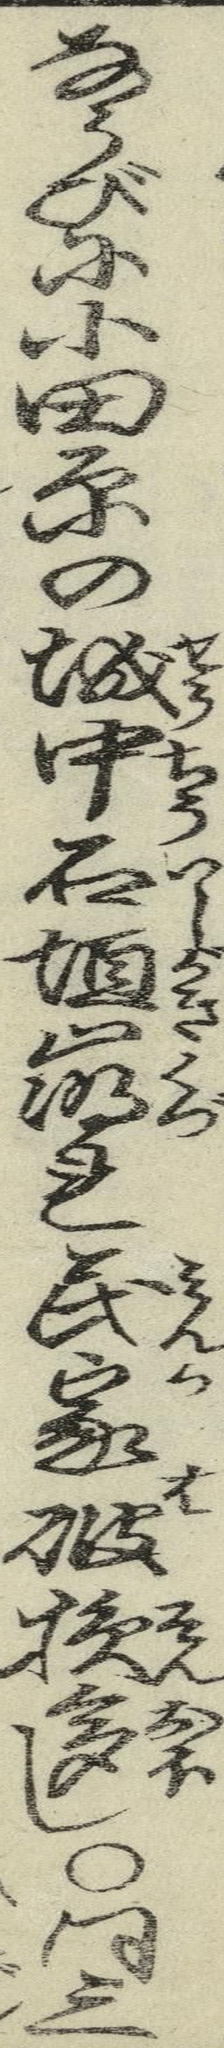ならびに小田原の城中石垣崩れ民家破損多し○同三
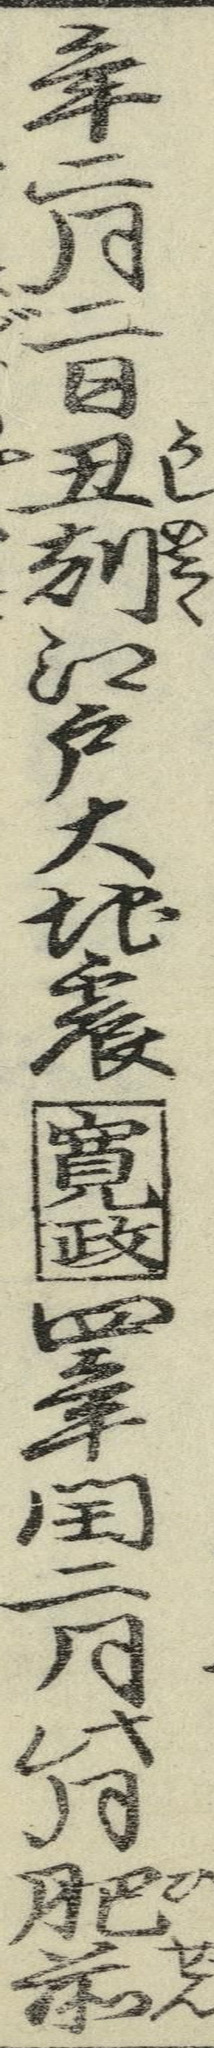年二月二日丑刻江戸大地震寛政四年閏二月此月肥前
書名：地震年代記
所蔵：東京大学地震研究所図書室 Earthquake Research Institute Library, The University of Tokyo, JAPAN
